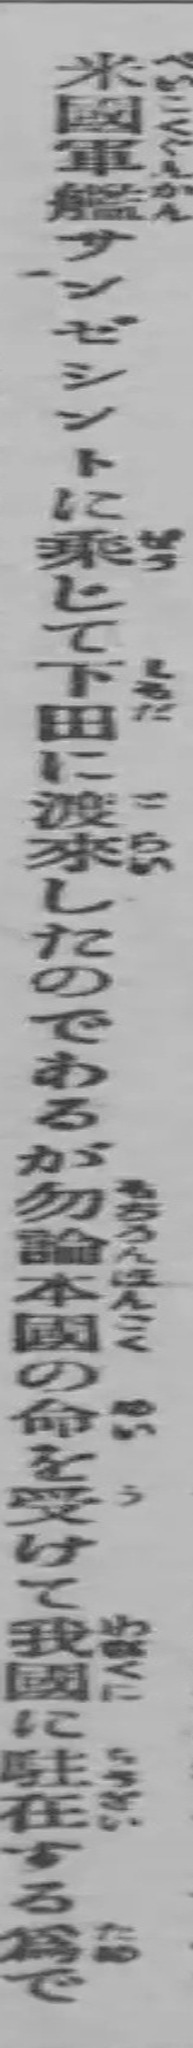米国軍艦サンゼシントに乗じて下田に渡来したのであるが勿論本国の命を受けて我国に駐在する為で
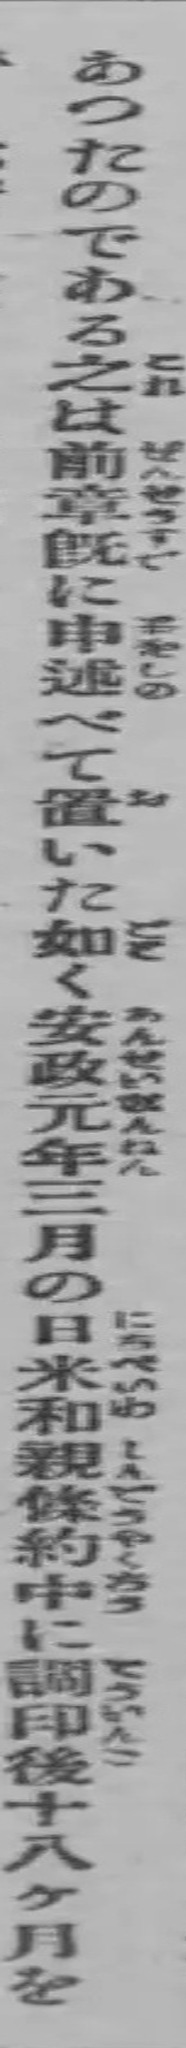あつたのである之は前章既に申述べて置いた如く安政元年三月の日米和親条約中に調印後十八ケ月を
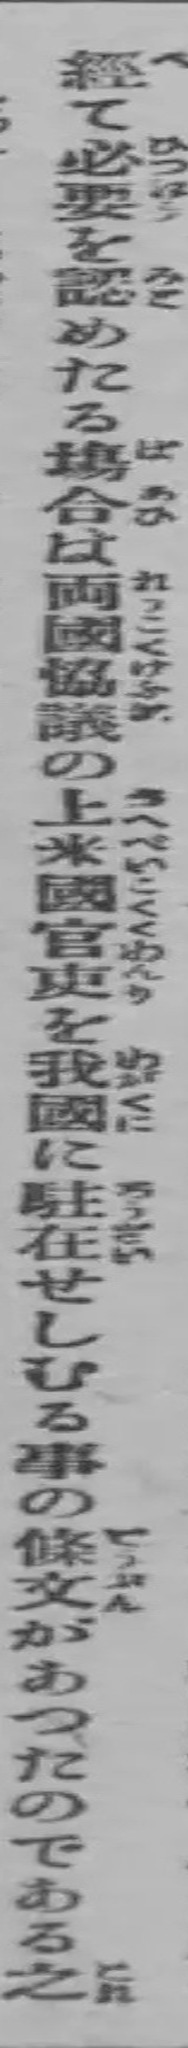経て必要を認めたる場合は両国協議の上米国官吏を我国に駐在せしむる事の条文があつたのである之
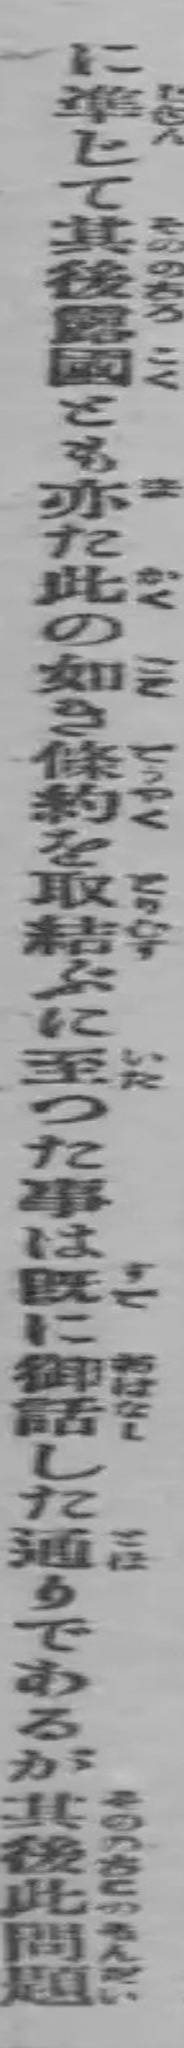に準じて其後露国とも亦た此の如き条約を取結ぶに至つた事は既に御話した通りであるが其後此問題

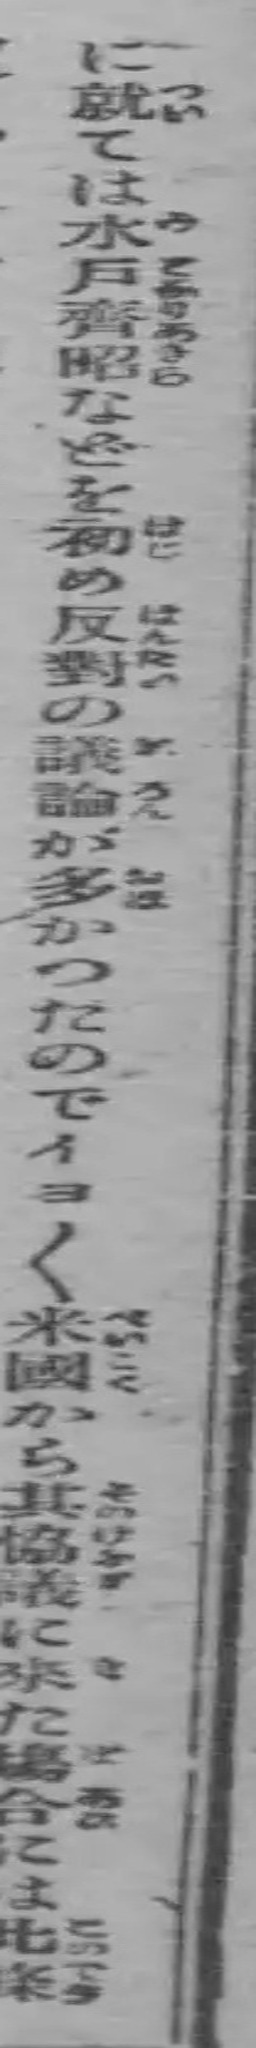に就ては水戸斉昭などを初め反対の議論が多かつたのでイヨ〳〵米国から其協議に来た場合には此条
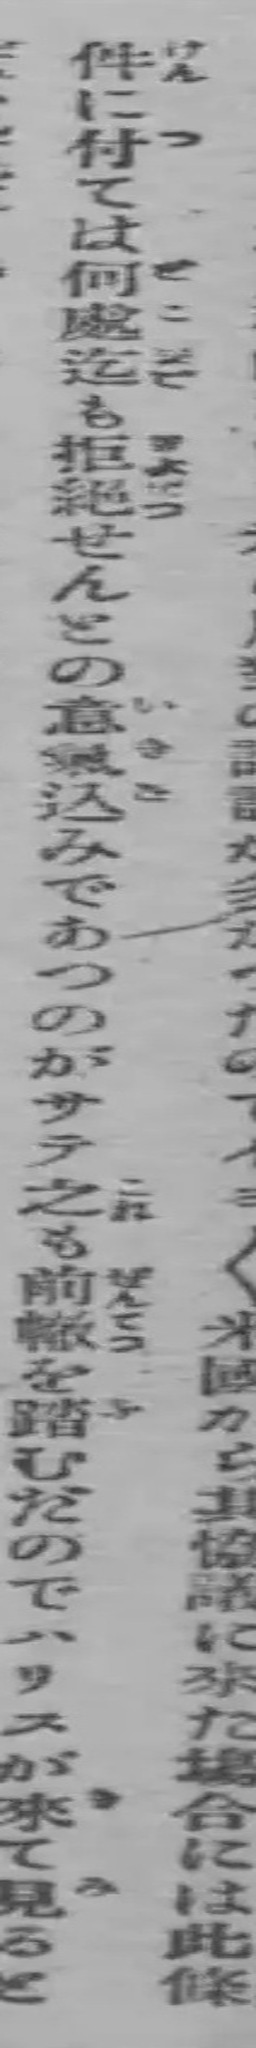件に付ては何処迄も拒絶せんとの意気込みであつたのがサテ之も前轍を踏むだのでハリスが来て見ると
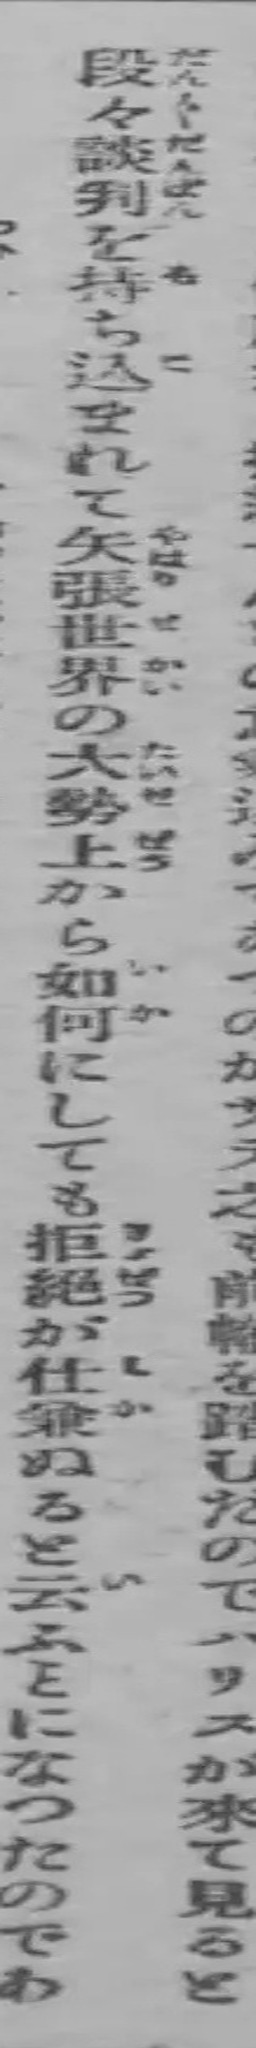段々談判を持ち込まれて矢張世界の大勢上から如何にしても拒絶がし仕兼ぬると云ふことになつたのであ
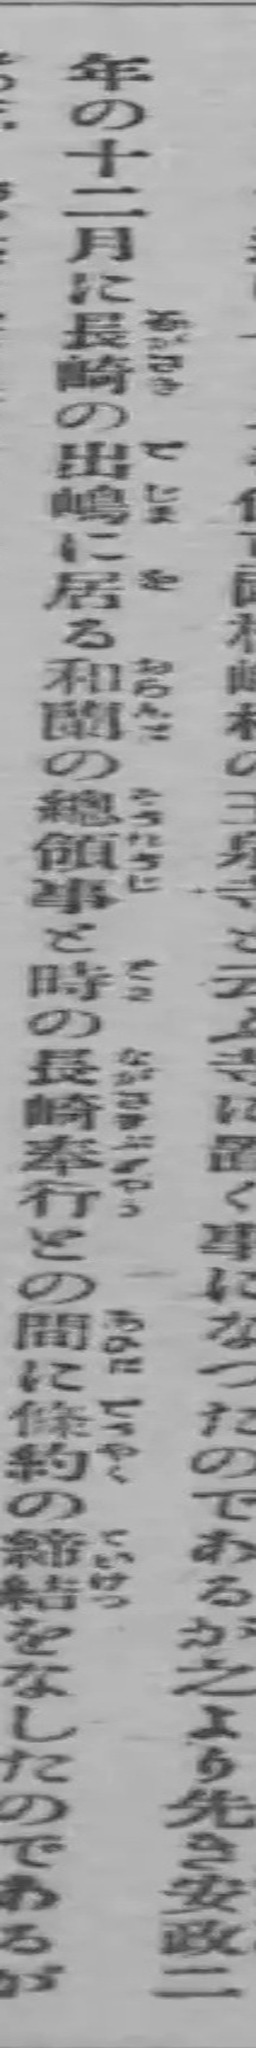年の十二月に長崎の出嶋に居る和蘭の総領事と時の長崎奉行との間に条約の締結をなしたのであるが
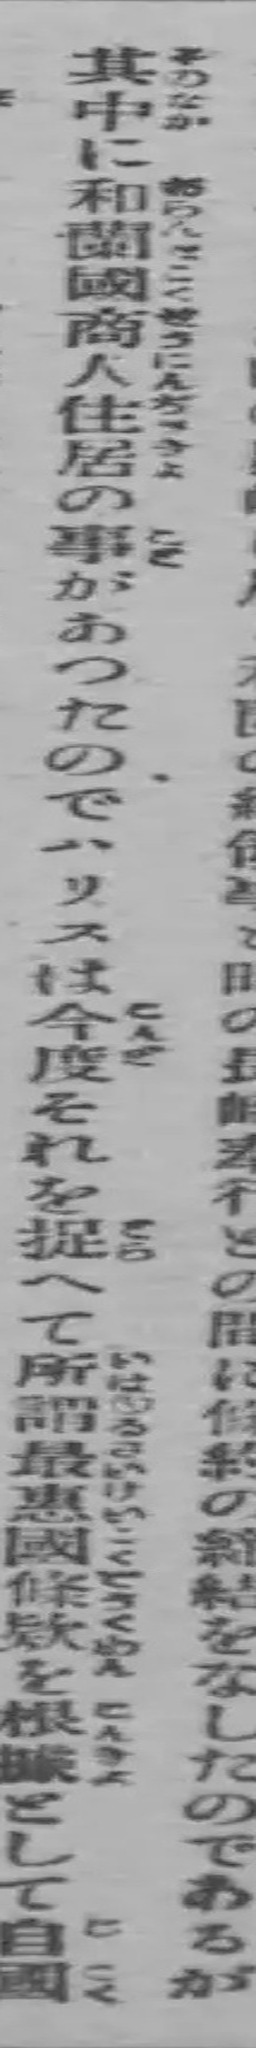其中に和蘭国商人住居の事があつたのでハリスは今度それを捉へて所謂最恵国条欵を根拠として自国
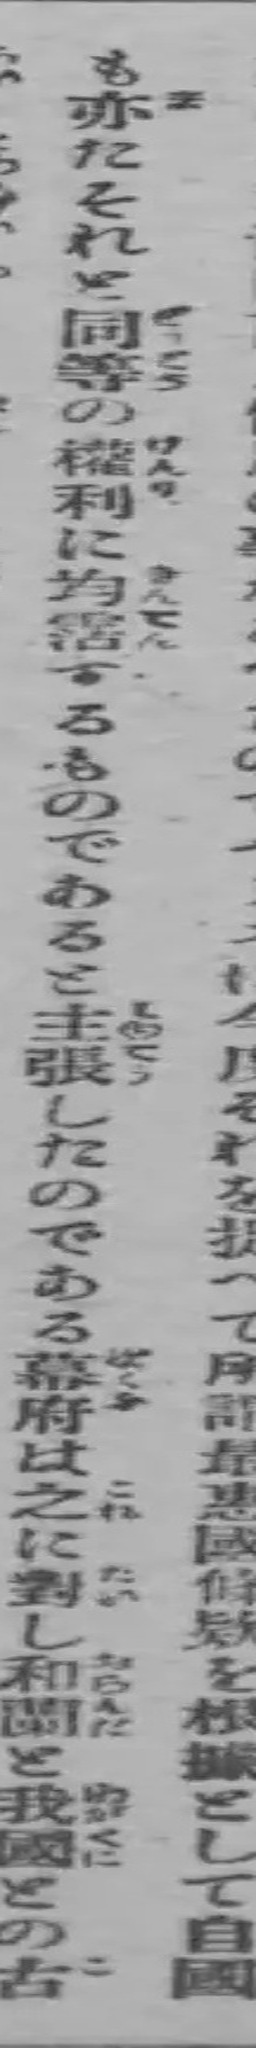も亦たそれと同等の権利に均霑するものであると主張したのである幕府は之に対し和蘭と我国との古
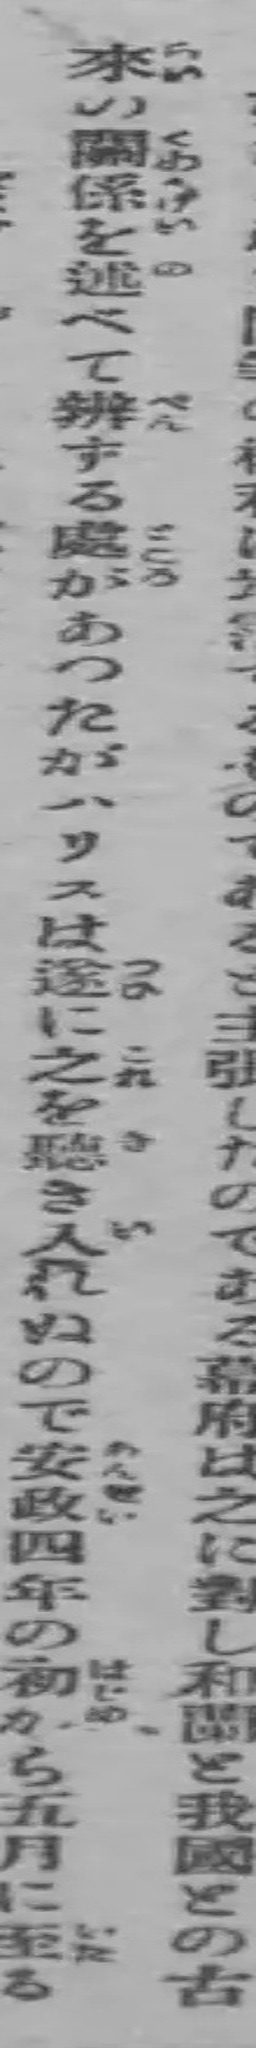来の関係を述べて弁ずる処があつたがハリスは遂に之を聴き入れぬので安政四年の初から五月に至る
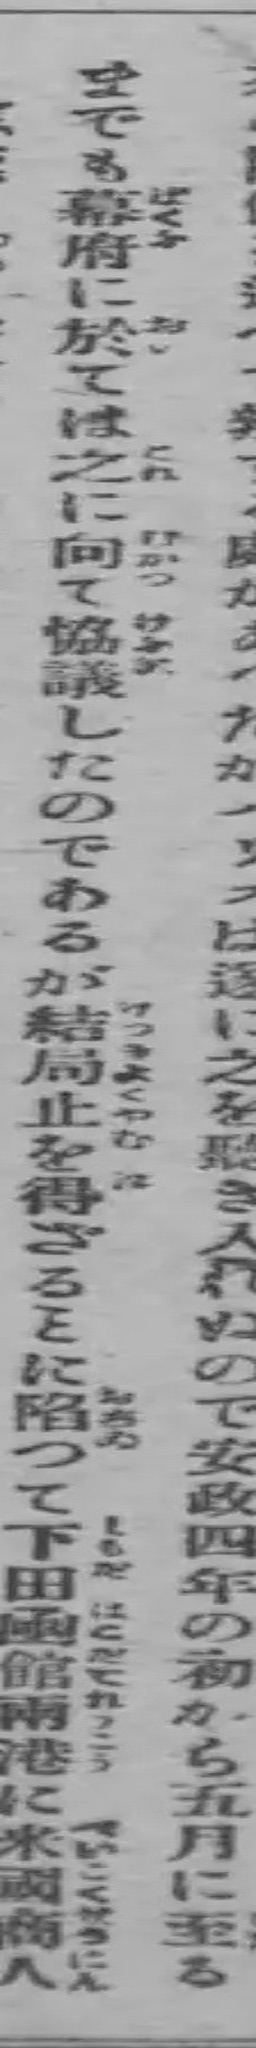までも幕府に於ては之に向て協議したのであるが結局止を得ざることに陥つて下田函館両港に米国商人
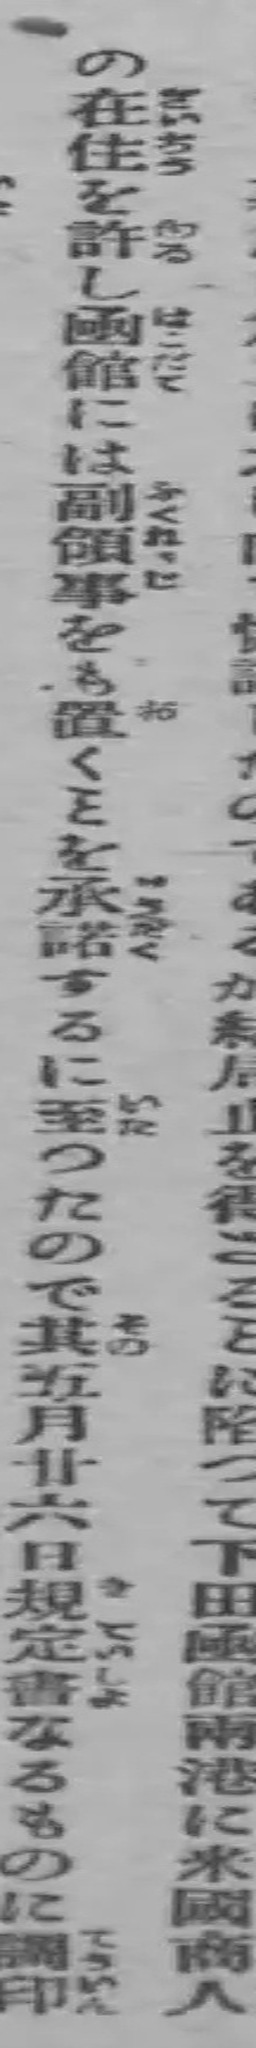の在住を許し函館には副領事をも置くことを承諾するに至つたので其五月廿六日規定書なるものに調印
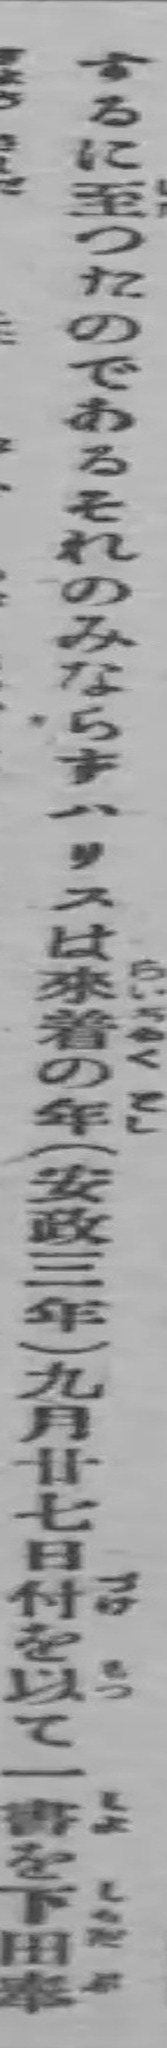するに至つたのであるそれのみならずハリスは来着の年(安政三年)九月廿七日付を以て一書を下田奉
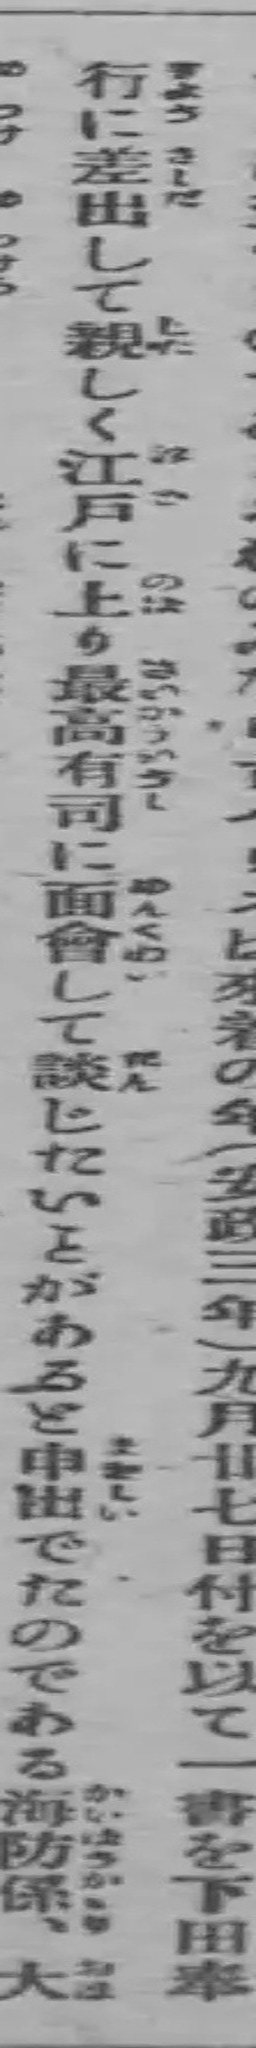行に差出して親しく江戸に上り最高有司に面会して談じたいことがあると申出でたのである海防係、大
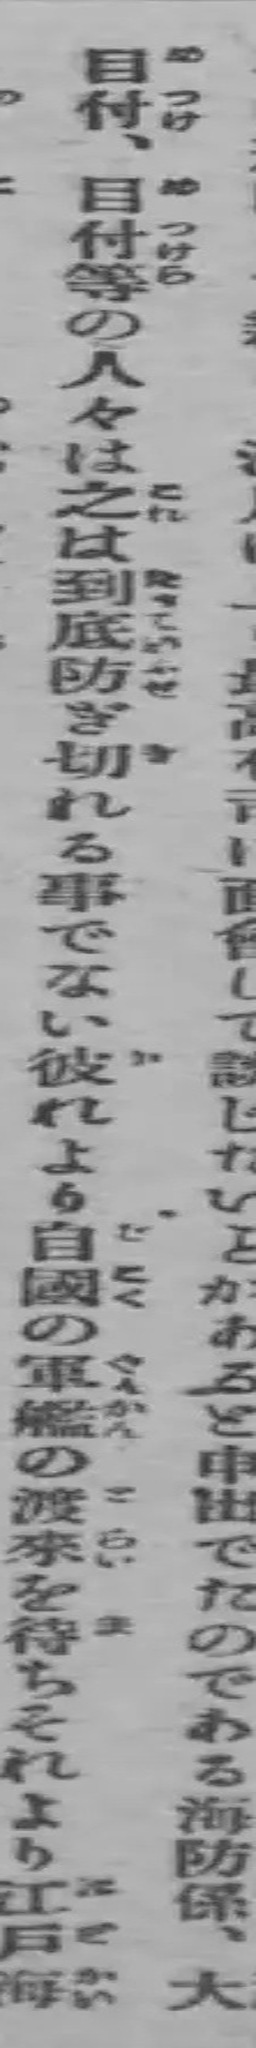目付、目付等の人々は之は到底防ぎ切れる事ではない彼れより自国の軍艦の渡来を待ちそれより江戸海
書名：豊橋市史談
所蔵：国立国会図書館 National Diet Library, JAPAN
